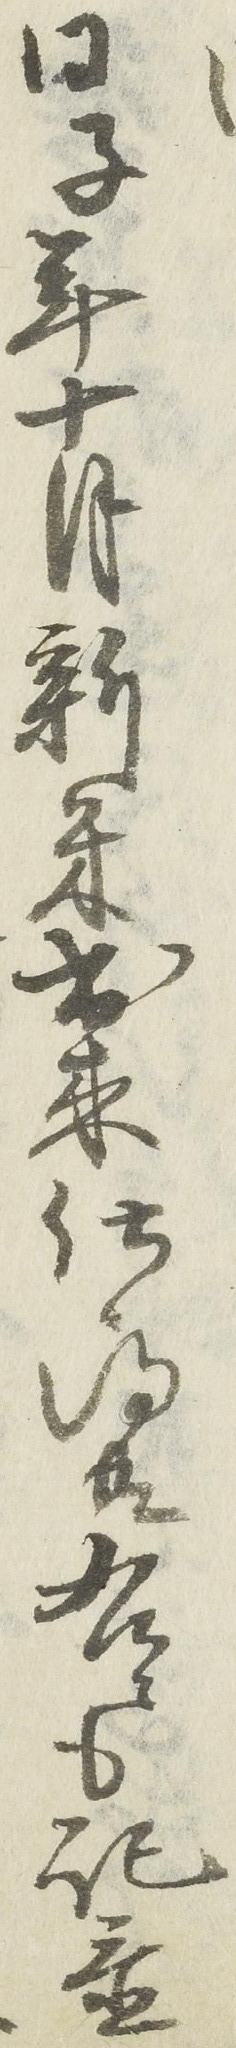一同子年十月新米出来仕候得共右ニも記置
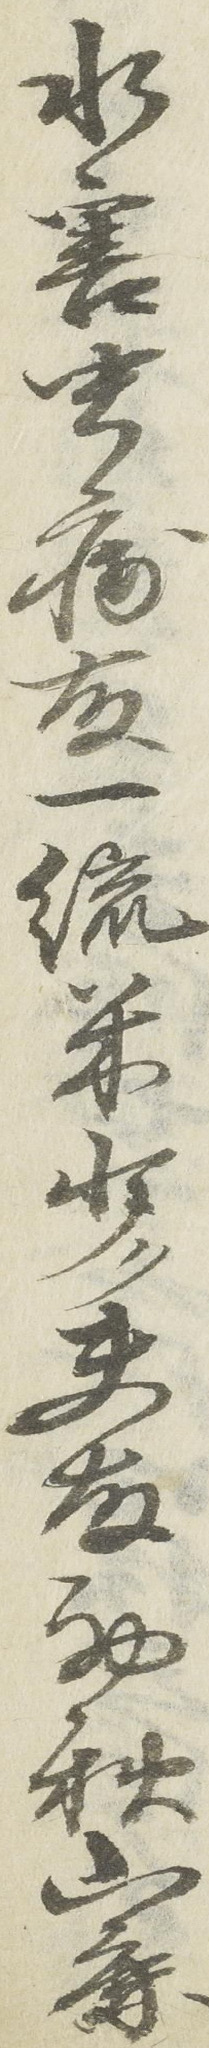水害虫病故一統米少ク夫故西秋山鹿

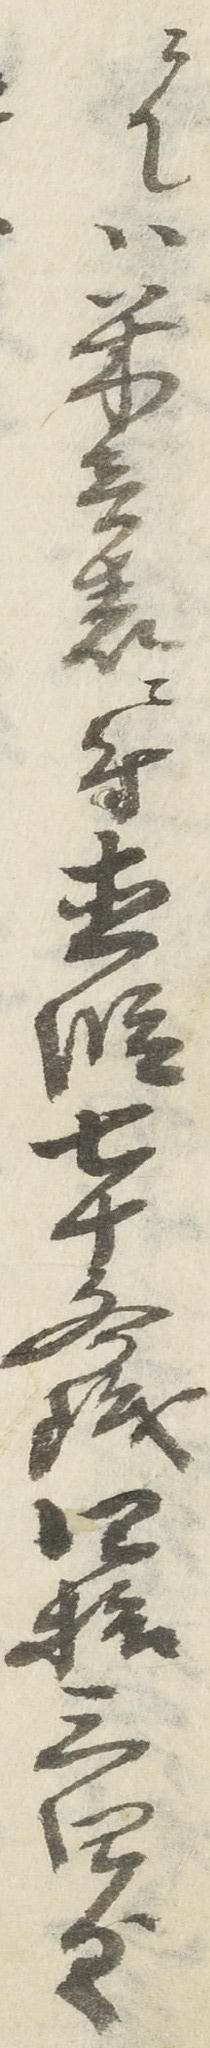ニては米壱表ニ付直段七拾文銭四拾三四匁
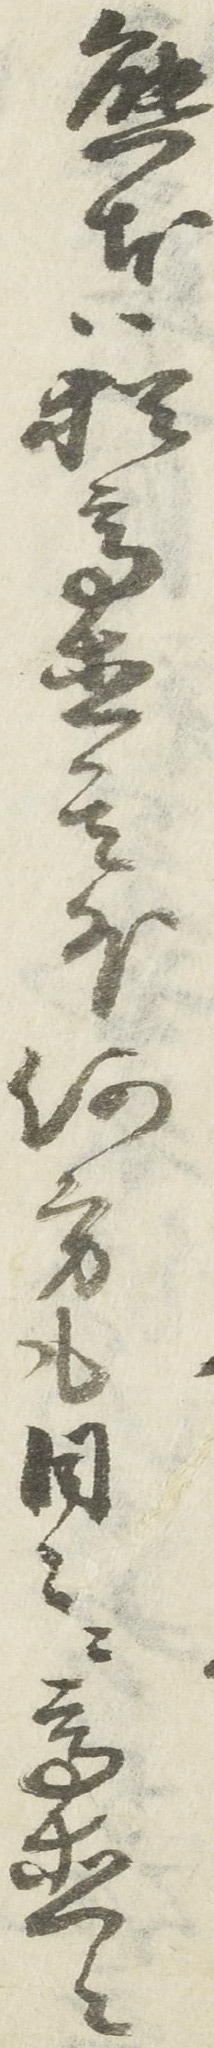熊本は猶高直其外何方も日々ニ高直ニ
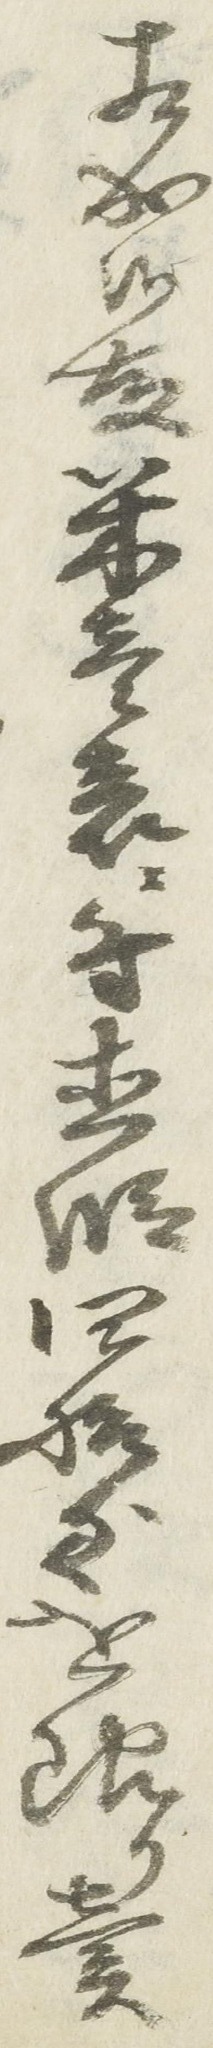相成候故米壱表ニ付直段四拾匁を限り売
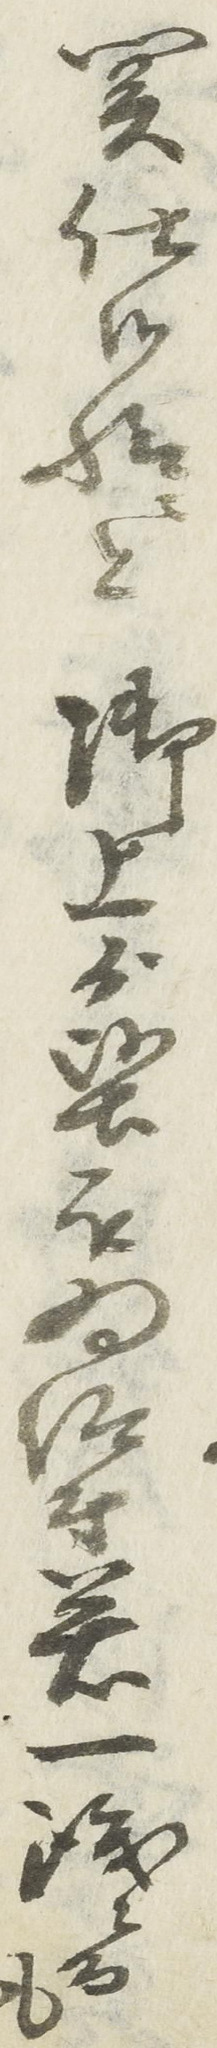買仕候様ニと御上ゟ堅被為仰付若一銭ニ而も
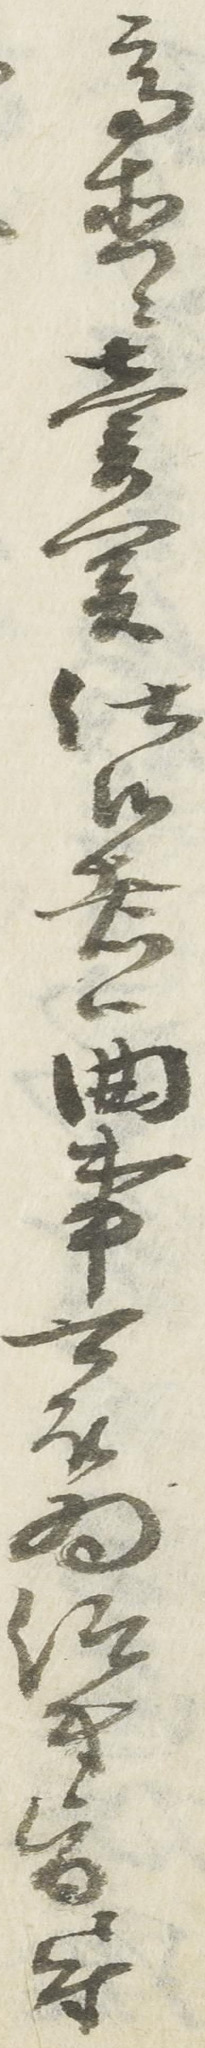高直ニ売買仕候者は曲事可被為仰付候旨ニ付
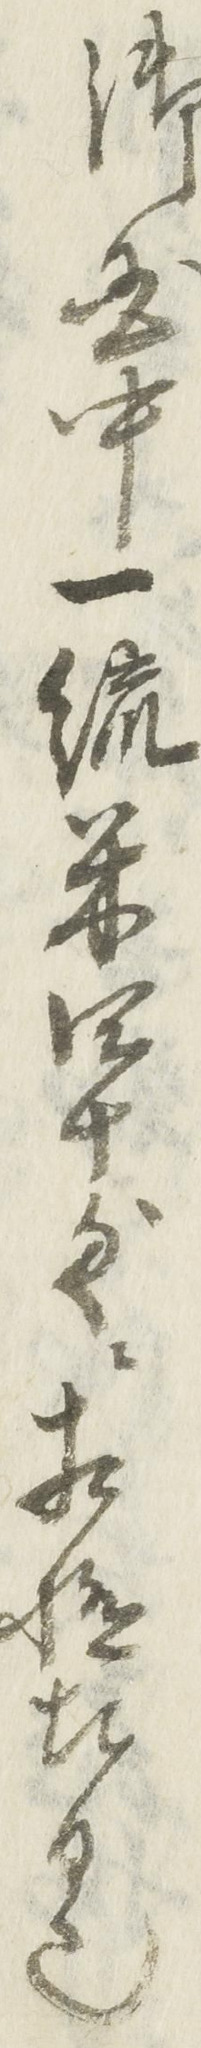御国中一統米四十匁ニ相極たる也
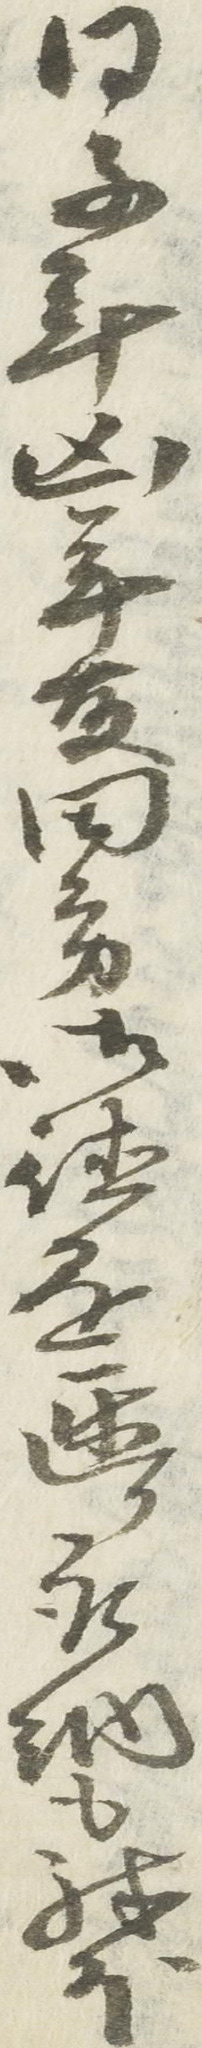一同子年凶年故田方御徳懸速ク取納も殊外
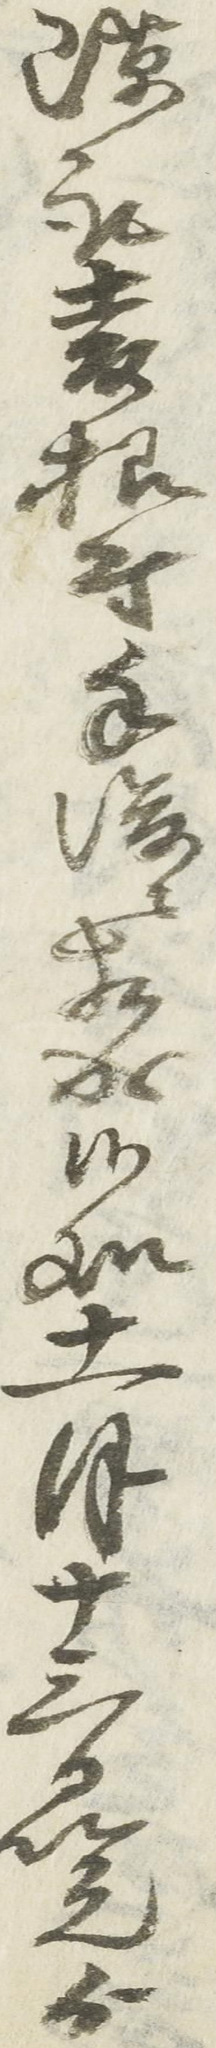隙取麦根付手後ニ相成候処十一月十三日晩ゟ
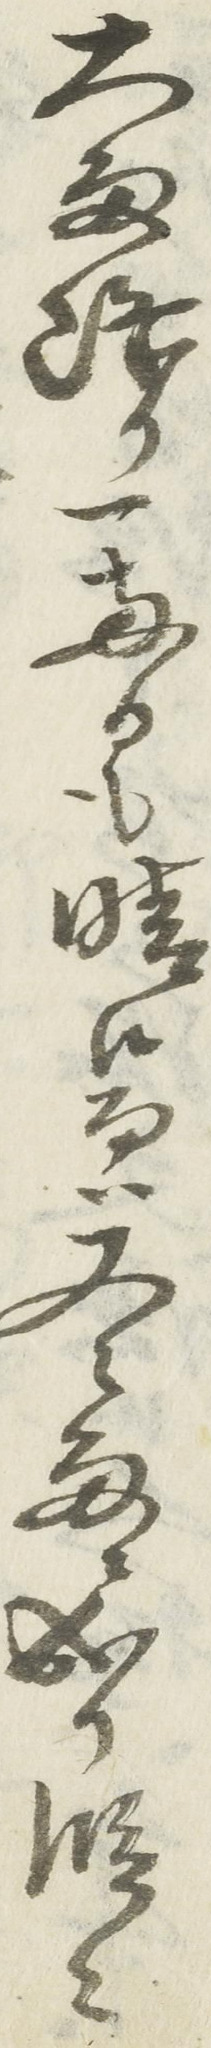大雨降り一両日も晴候而は又々雨ニ成り段々
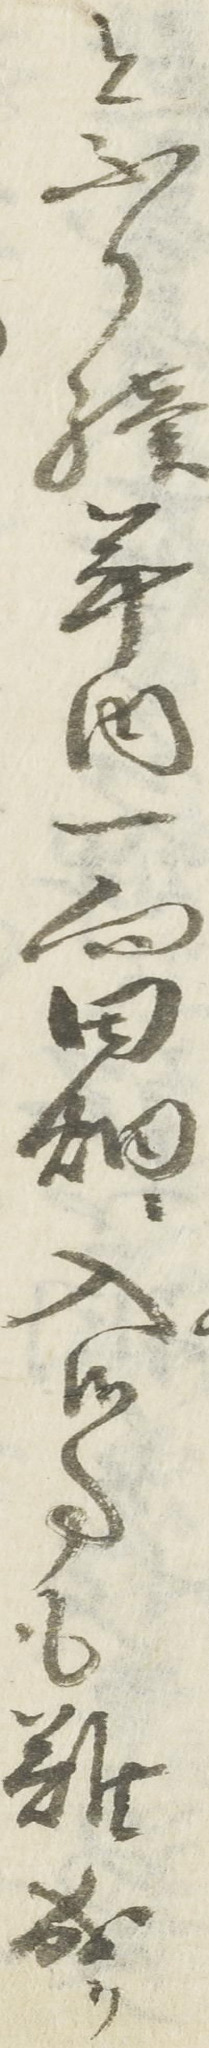とふり続年内一向田畑ニ入候事も難成り
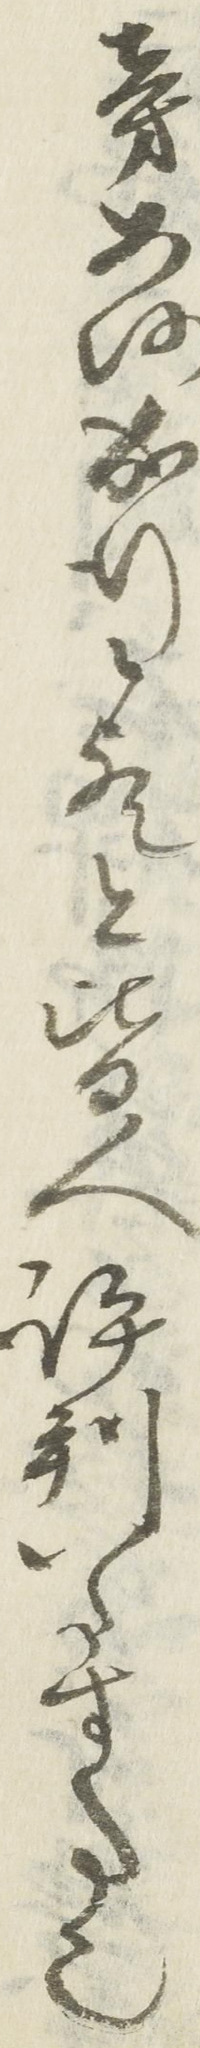旁如何成行候歟と皆人評判いたす事也
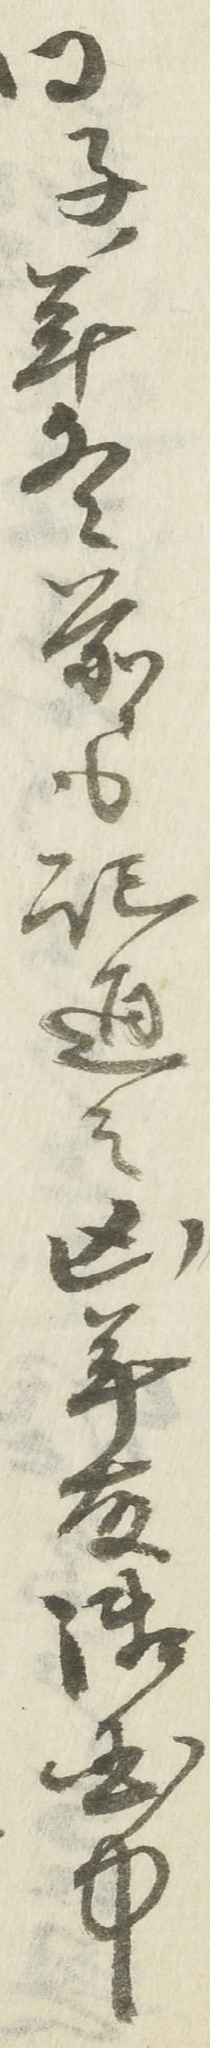一同子ノ年冬前も記通の凶年故御国中
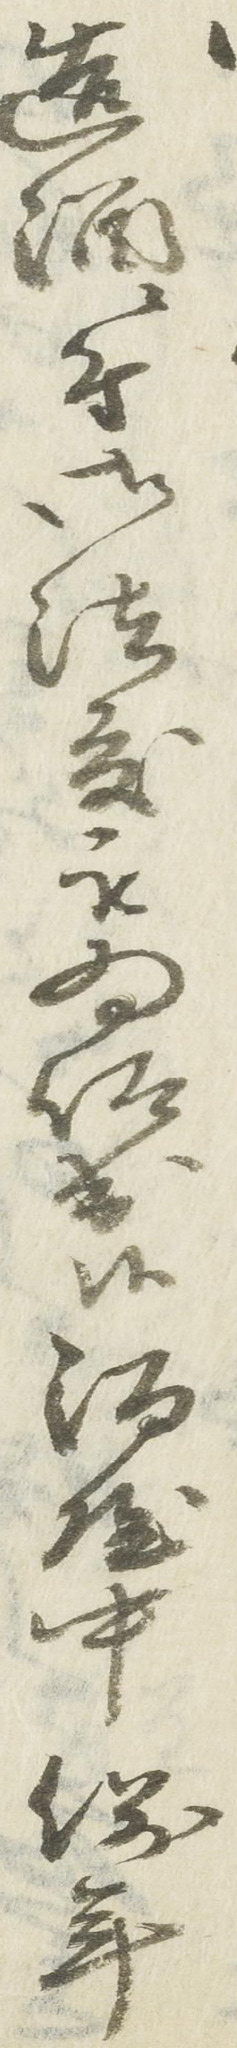造酒ニ付御法度被為仰出候酒屋中例年
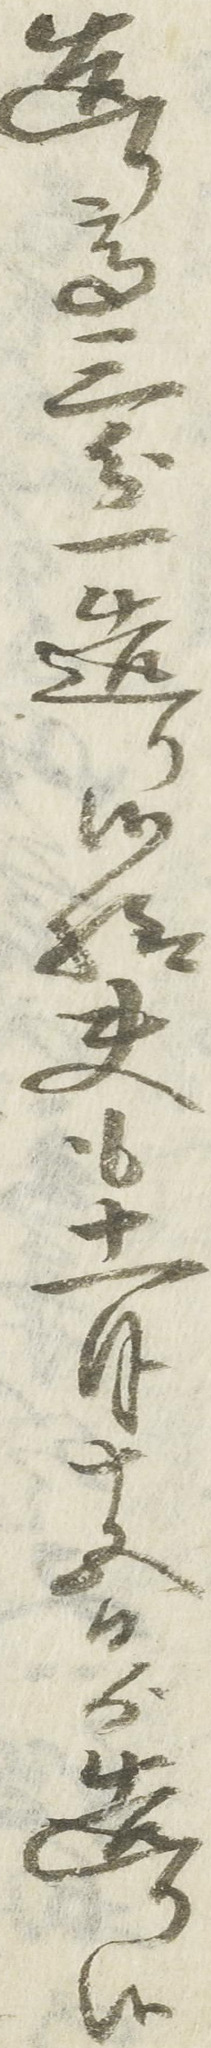造り高三分一作り候様夫も十一月十五日ゟ造り候
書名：後見笑
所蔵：東京大学地震研究所図書室 Earthquake Research Institute Library, The University of Tokyo, JAPAN
